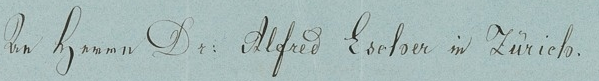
An Herrn Dr: Alfred Escher in Zürich.
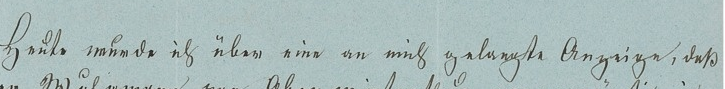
Heute wurde ich über eine an mich gelangte Anzeige, dass
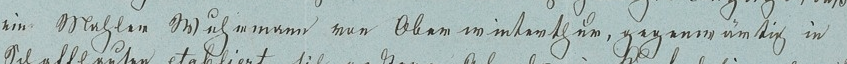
ein Mahler Wuhrmann von Oberwinterthur, gegenwärtig in
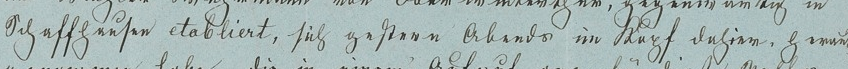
Schaffhausen etabliert, sich gestern Abends im Kapf dahier, heraus-
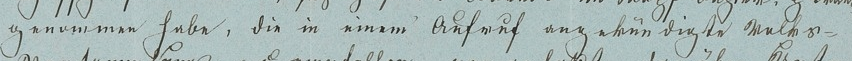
genommen habe, die in einem Aufruf angekündigte Volks-
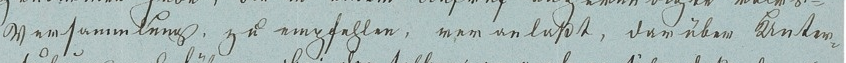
Versammlung, zu empfehlen, veranlaßt, darüber Unter-
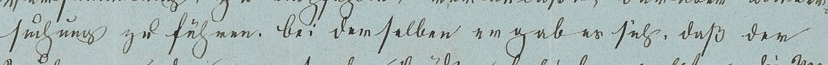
suchung zu führen. Bei demselben ergab es sich, daß der
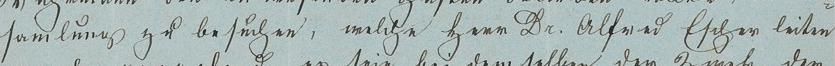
sammlung zu besuchen, welche Herr Dr. Alfred Escher leiten
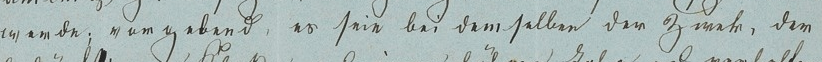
werde; vorgebend, es seie bei demselben der Zweck, der
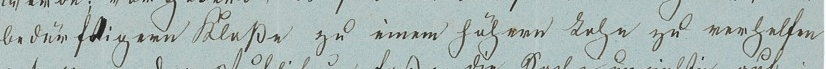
bedürftigern Klasse zu einem höhern Lohn zu verhelfen
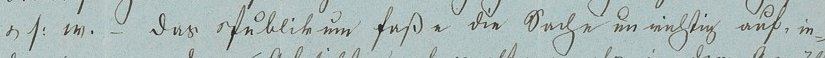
&s. w. – Das Publikum fasse die Sache unrichtig auf, in-
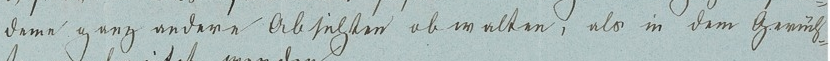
deme ganz andere Absichten obwalten, als in dem Gerüch-
